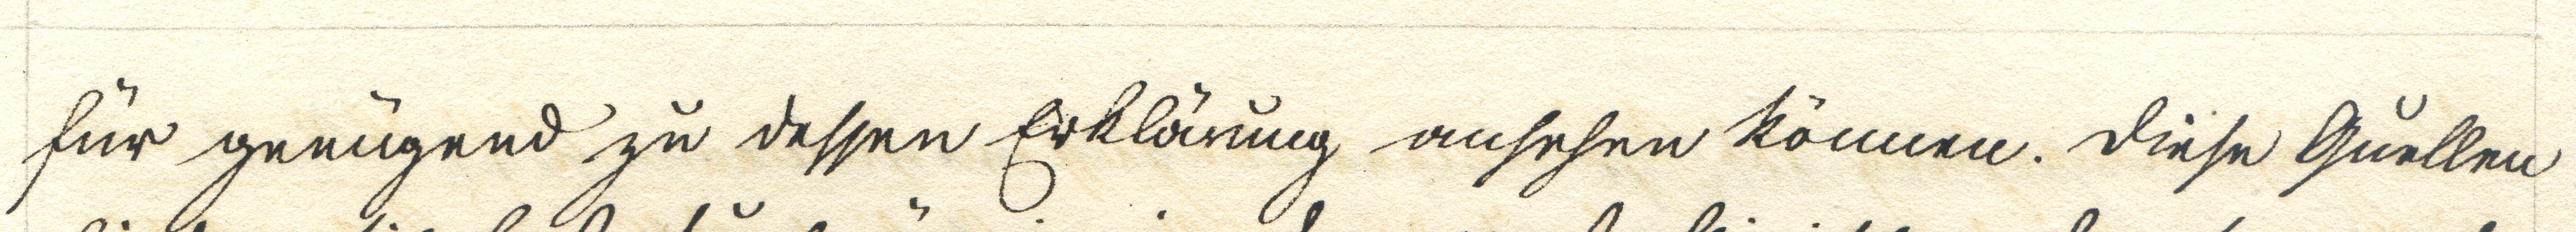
für genügend zu dessen Erklärung ansehen können. Diese Quellen
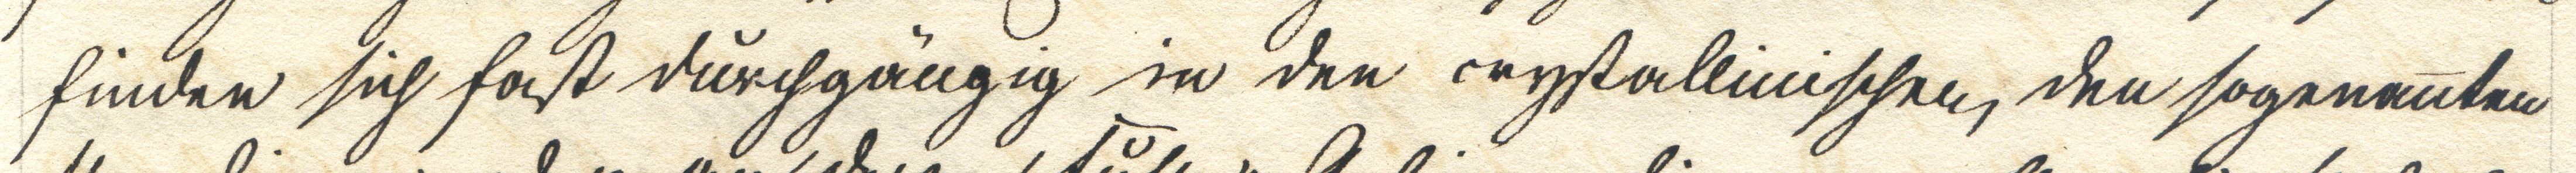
finden sich fast durchgängig in den crystallinischen, den sogenañten
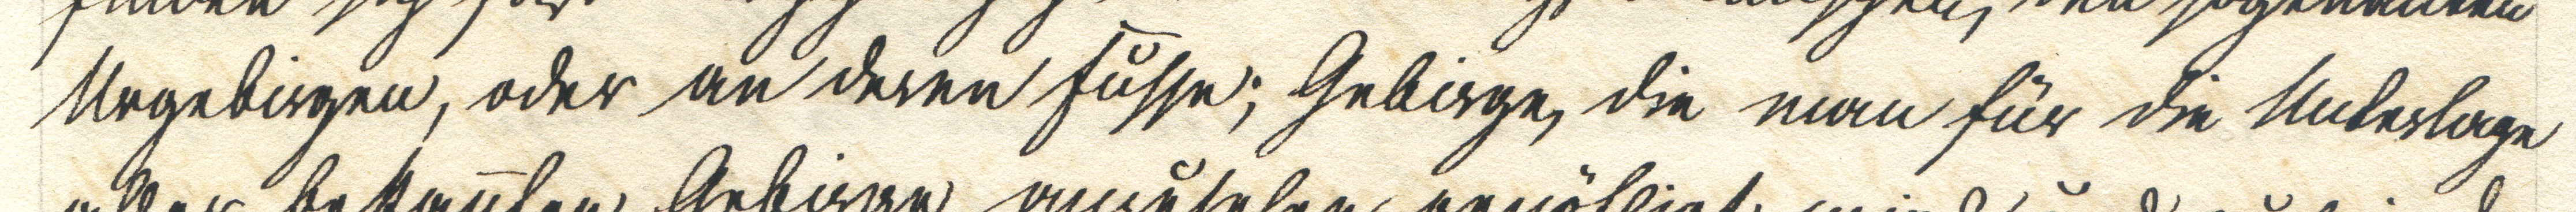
Urgebirgen, oder an deren Fusse; Gebirge, die man für die Unterlage
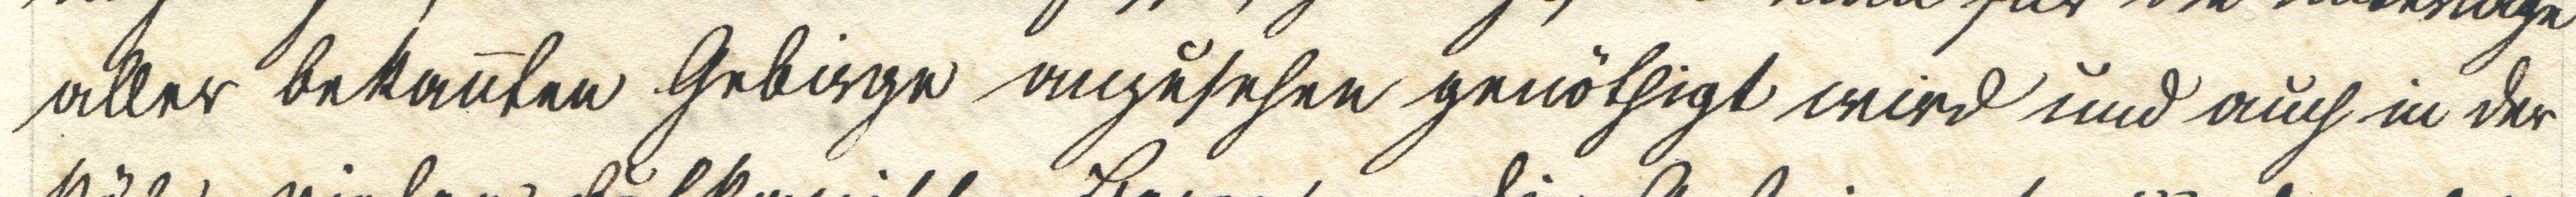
aller bekañten Gebirge anzusehen genöthigt wird und auch in der
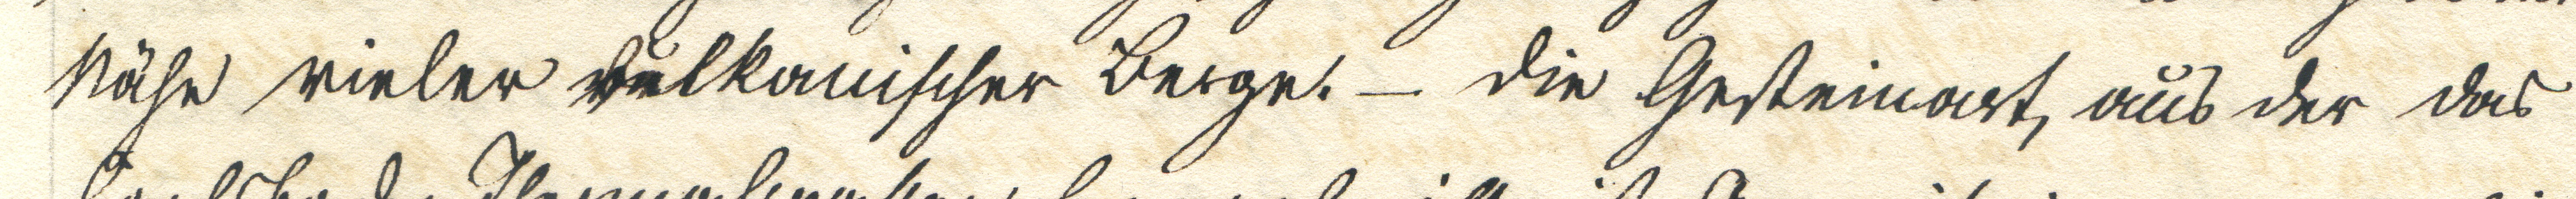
Nähe vieler bevulkanischer Berge. – Die Gesteinart, aus der das
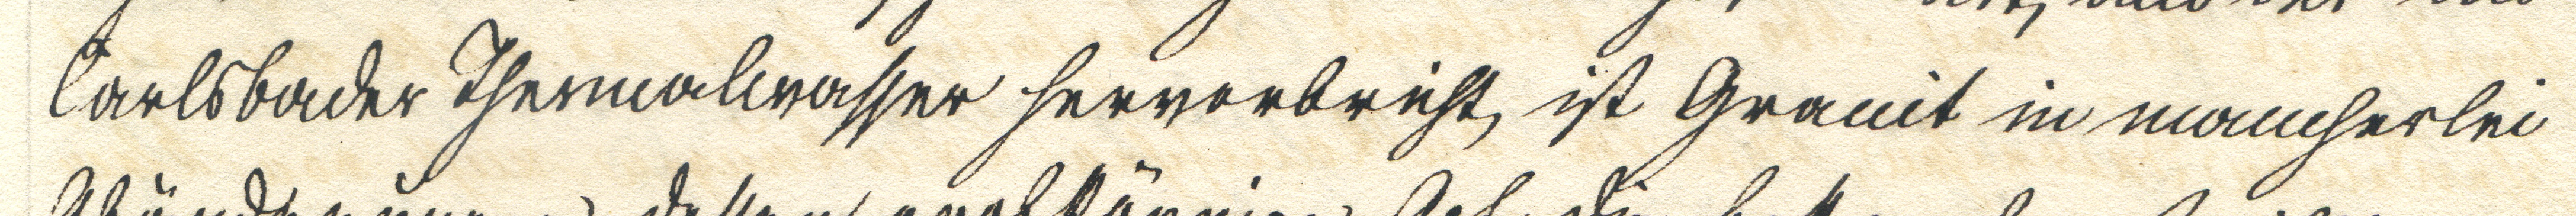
Carlsbader Thermalwasser hervorbricht, ist Granit in mancherlei
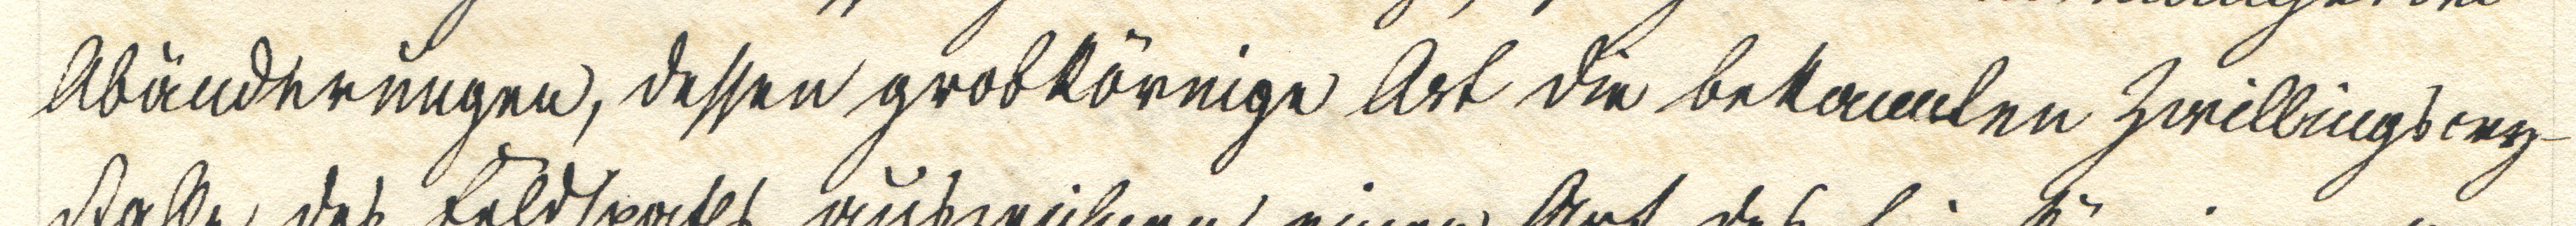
Abänderungen, dessen grobkörnige Art die bekannten Zwillingscry-
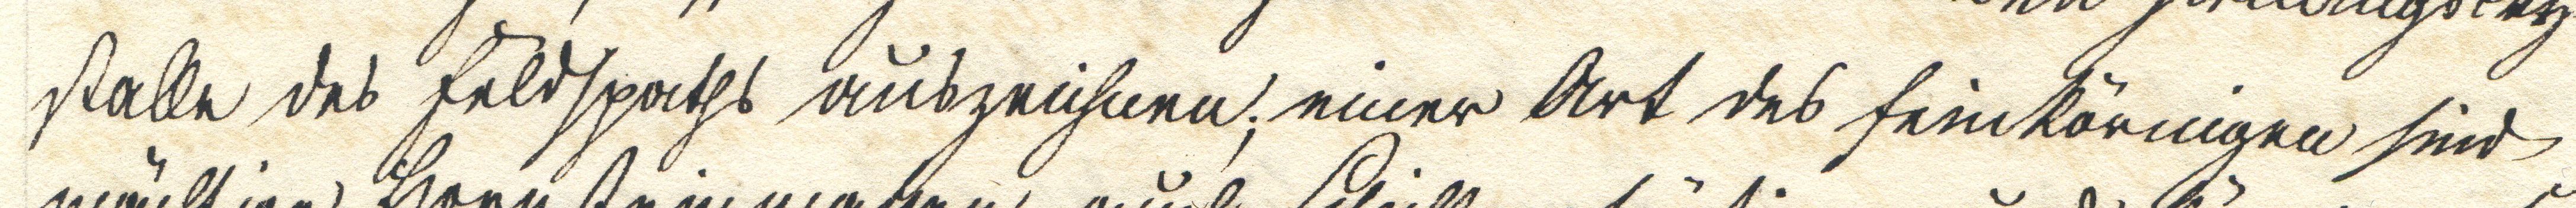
stalle des Feldspaths auszeichnen; einer Art des feinkörnigen sind
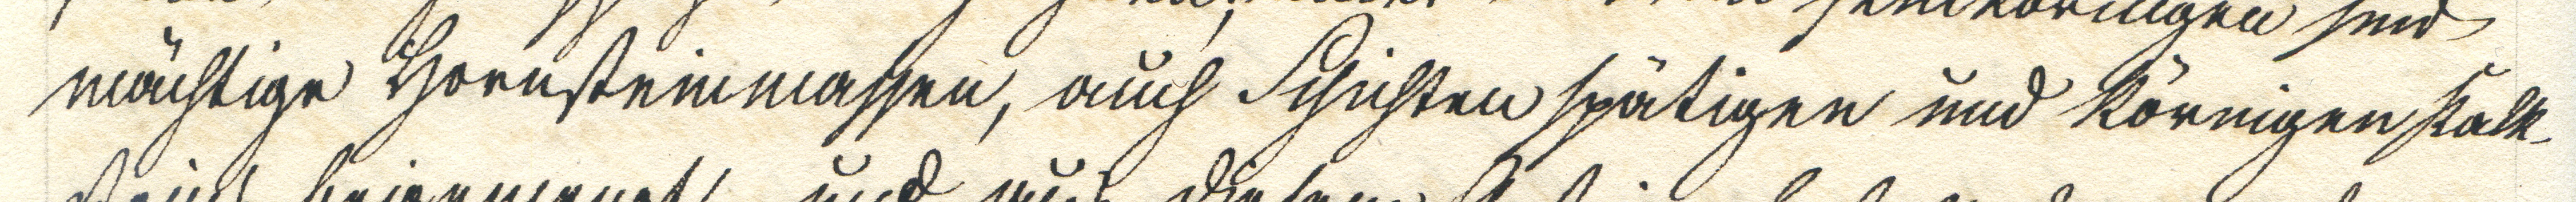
mächtige Hornsteinmassen, auch Schichten spätigen und körnigen Kalk-
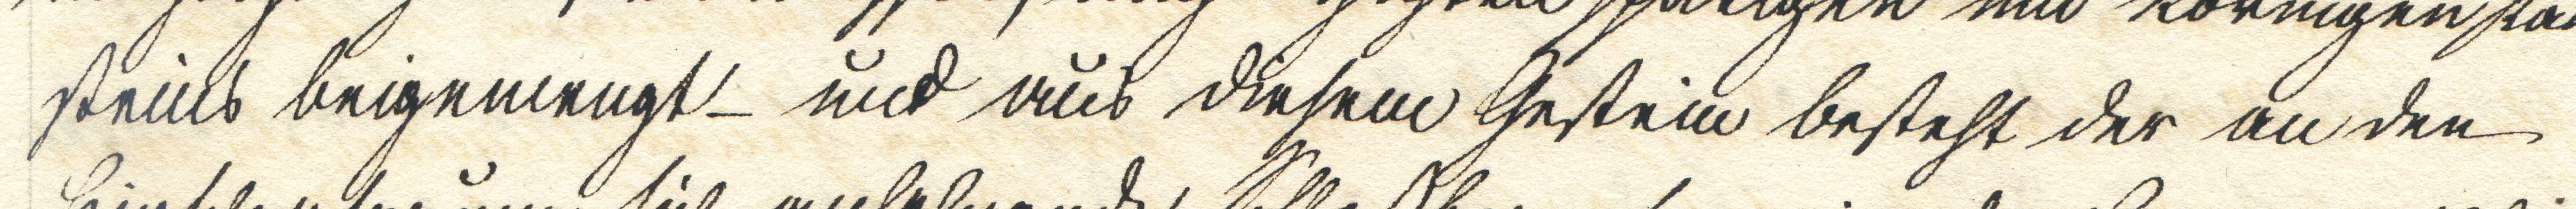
steins beigemengt – und aus diesem Gestein besteht der an den
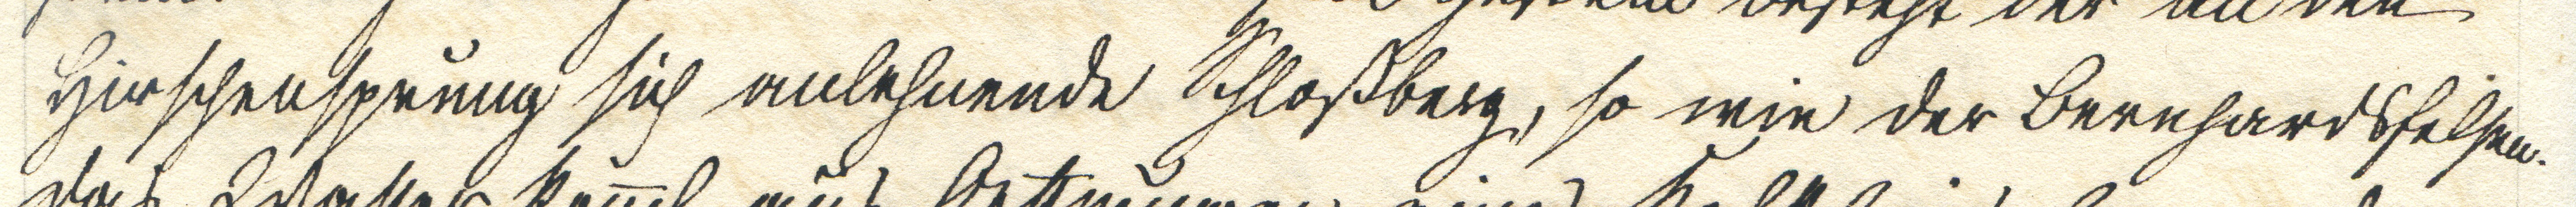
Hirschensprung sich anlehnende Schloßberg, so wie der Bernhardsfelsen.
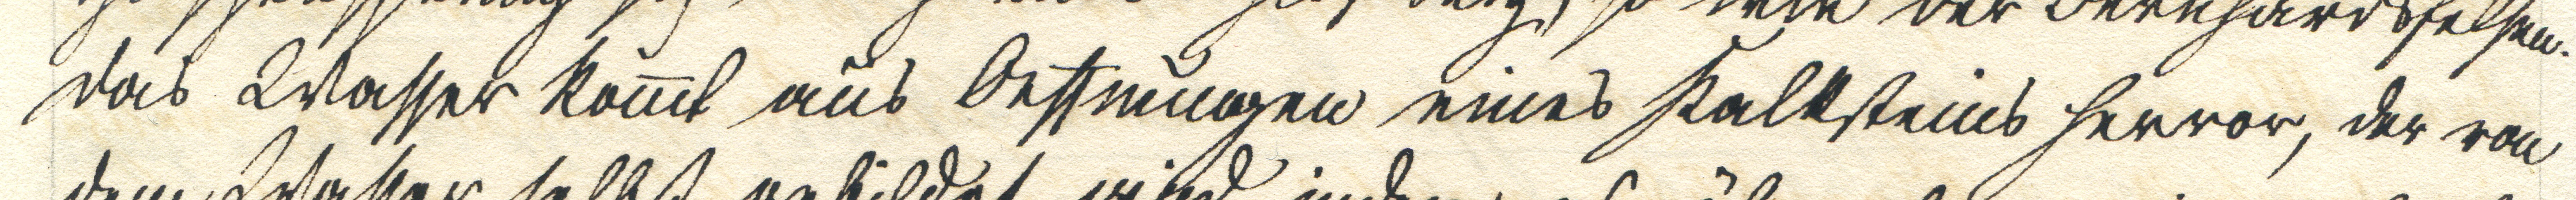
Das Wasser kom̃t aus Oeffnungen eines Kalksteins hervor, der von
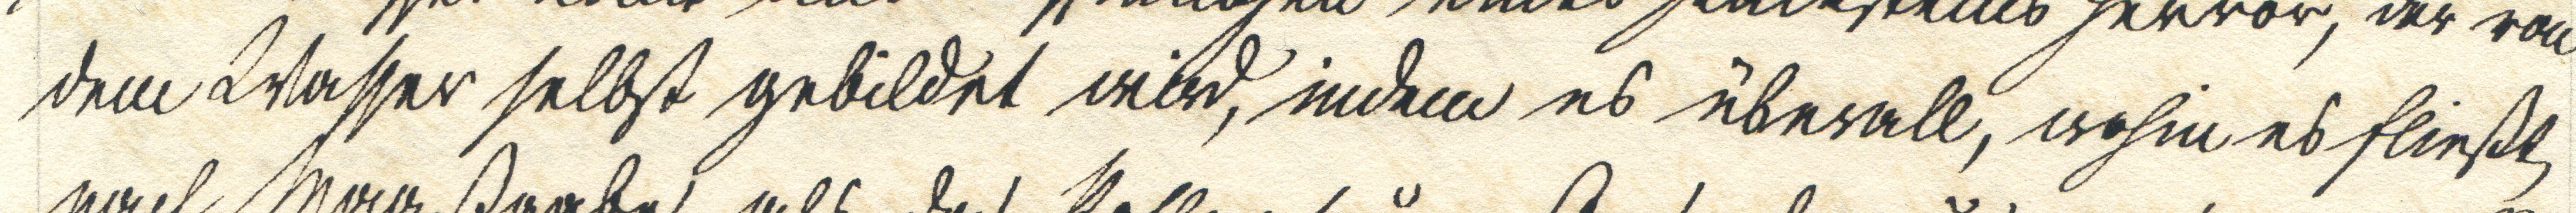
dem Wasser selbst gebildet wird, indem es überall, wohin es fließt,
